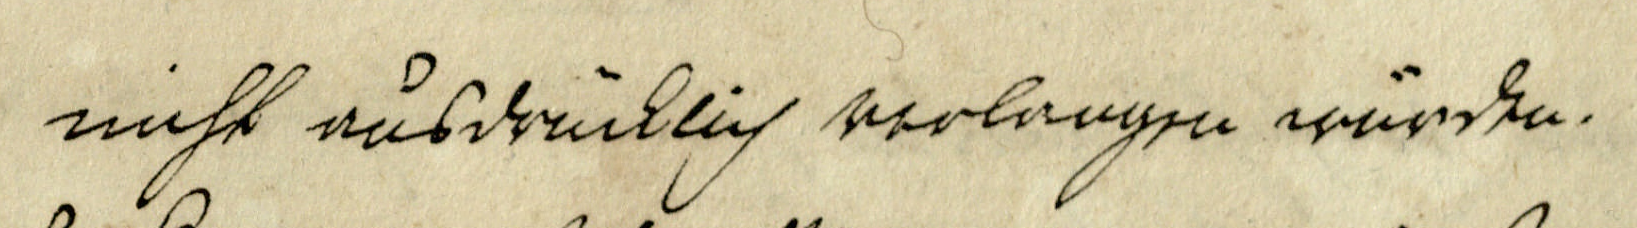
nicht ausdrücklich verlangen würden.
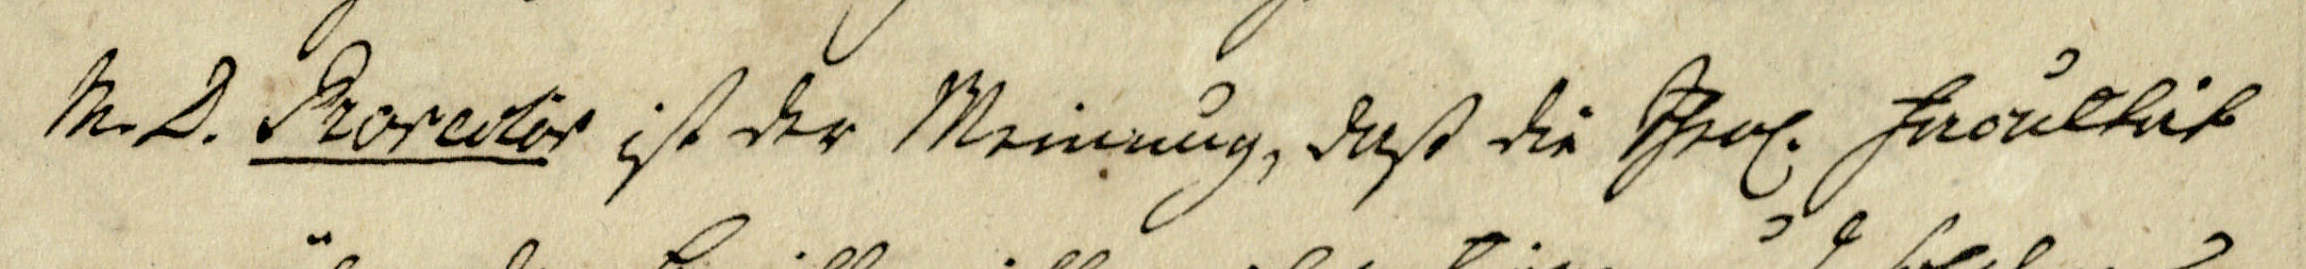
M. D. Prorector ist der Meinung, daß die Theol. Facultät
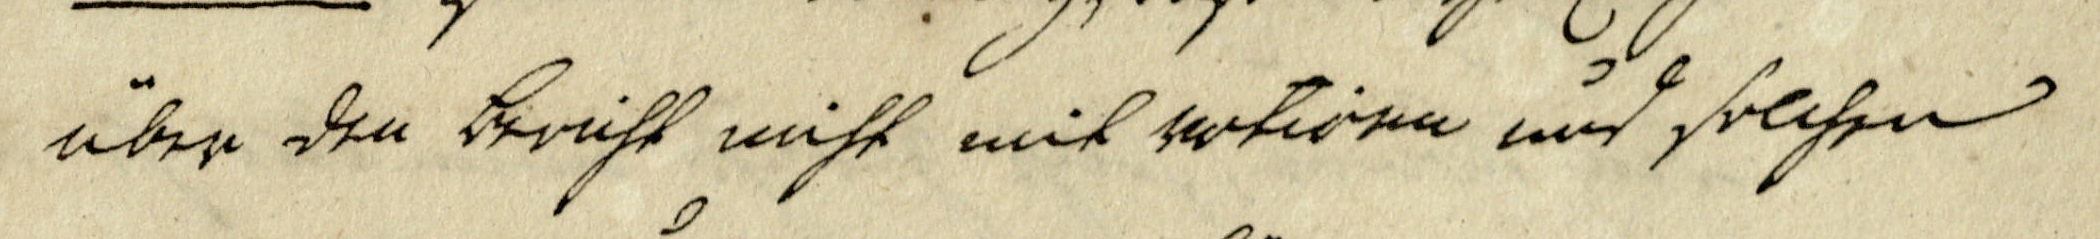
über den Bericht nicht mit votiren und solchen
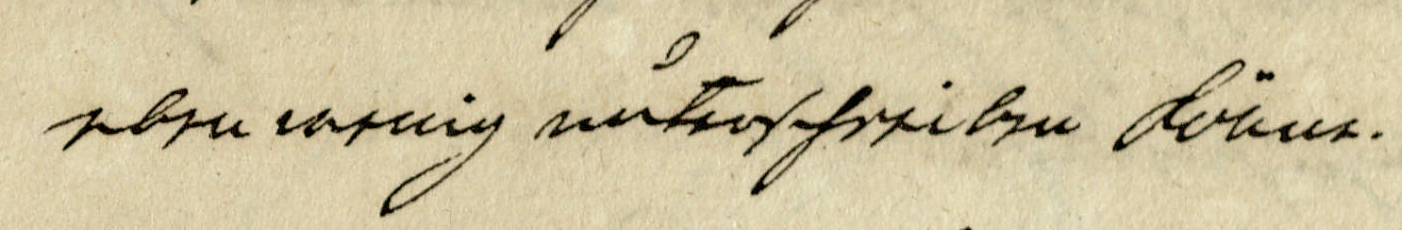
eben wenig unterschreiben könne.
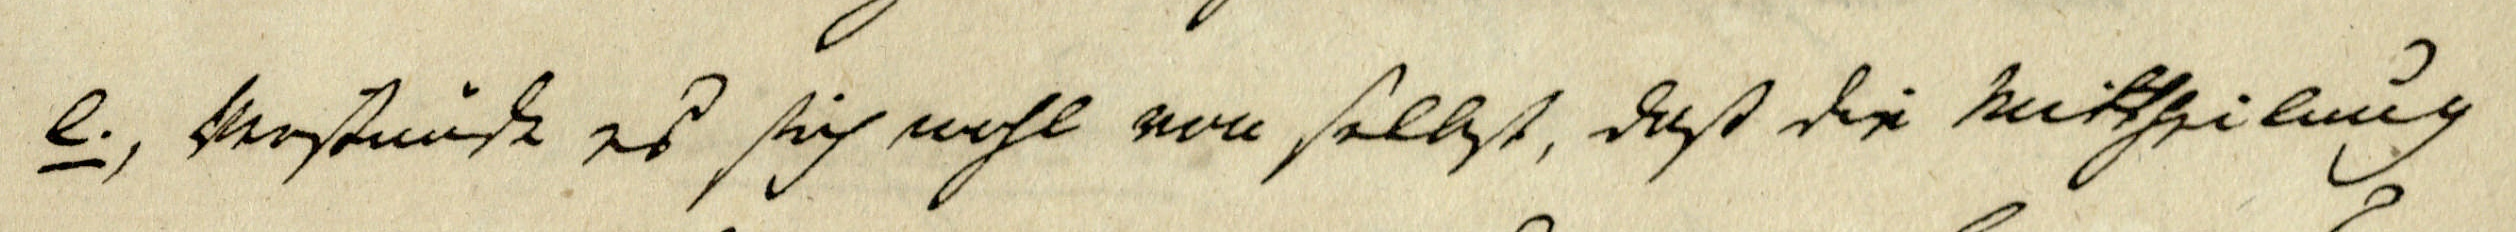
e., verstünde es sich wohl von selbst, daß die Mittheilung
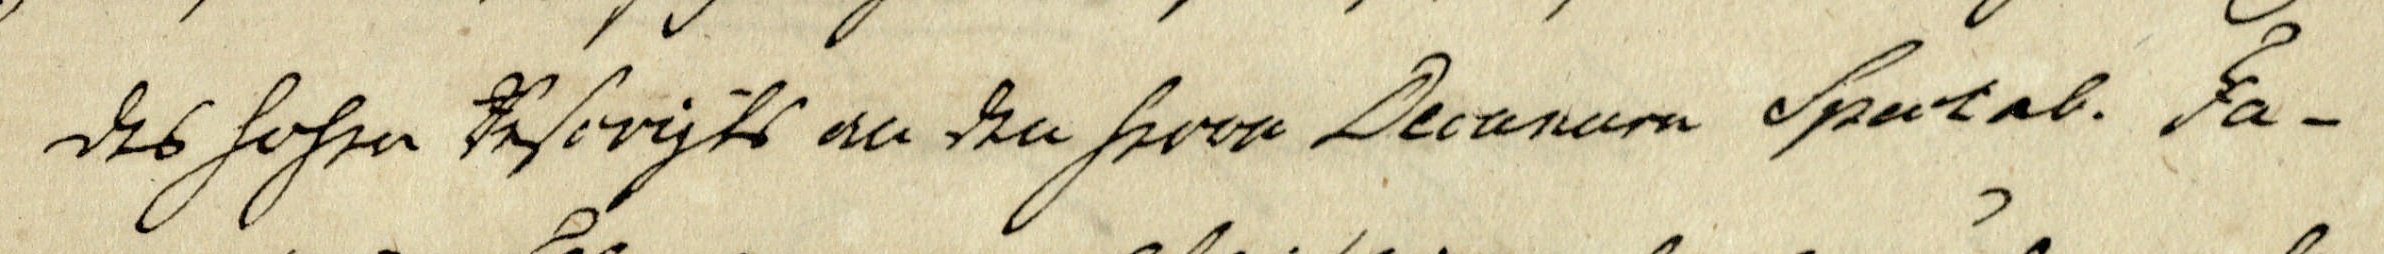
des hohen Rescripts an den Herrn Decanum Spectab. Fa¬
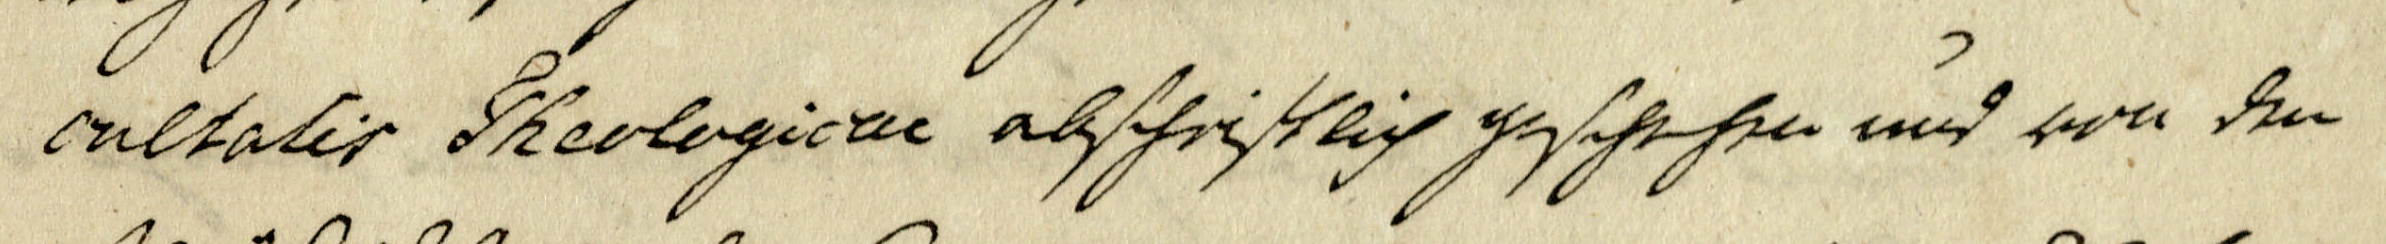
cultatis Theologicae abschriftlich geschehen und von den
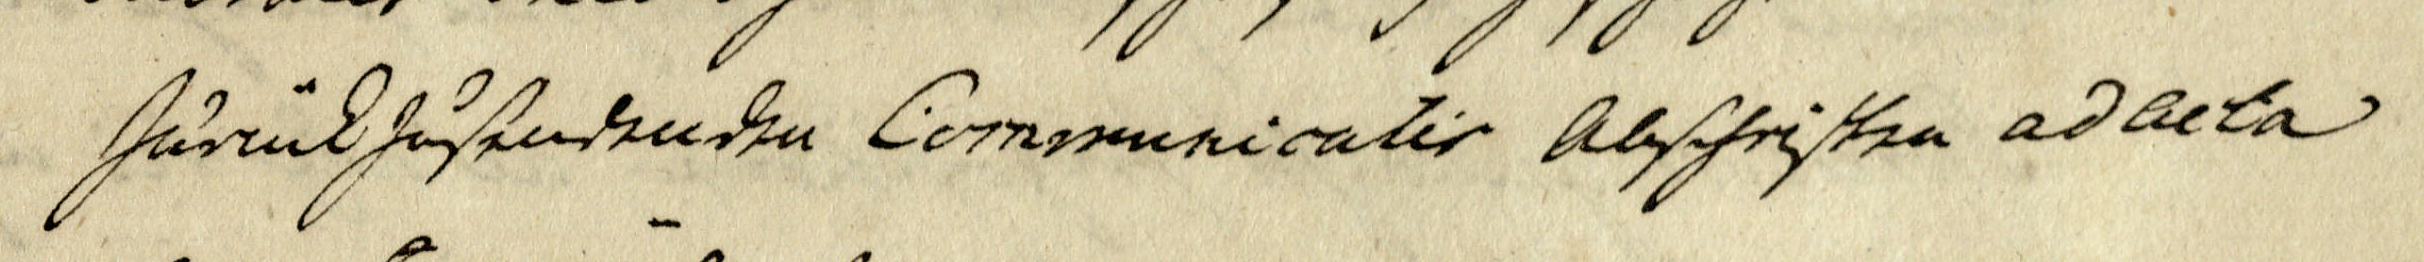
zurückzusendenden Communicatis Abschriften ad Acta
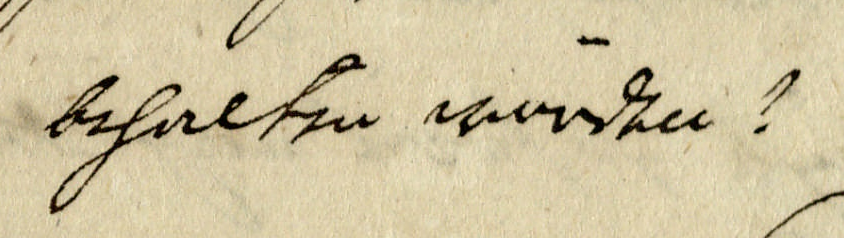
behalten würden?
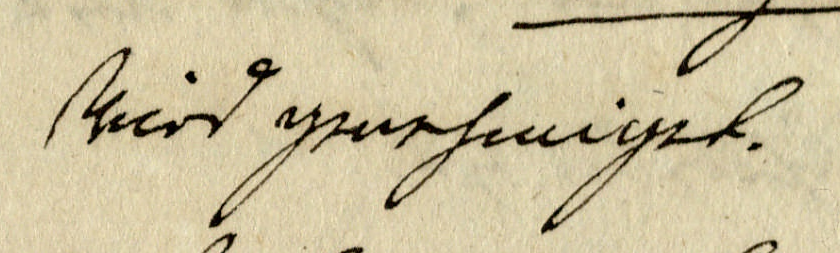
Wird genehmiget.
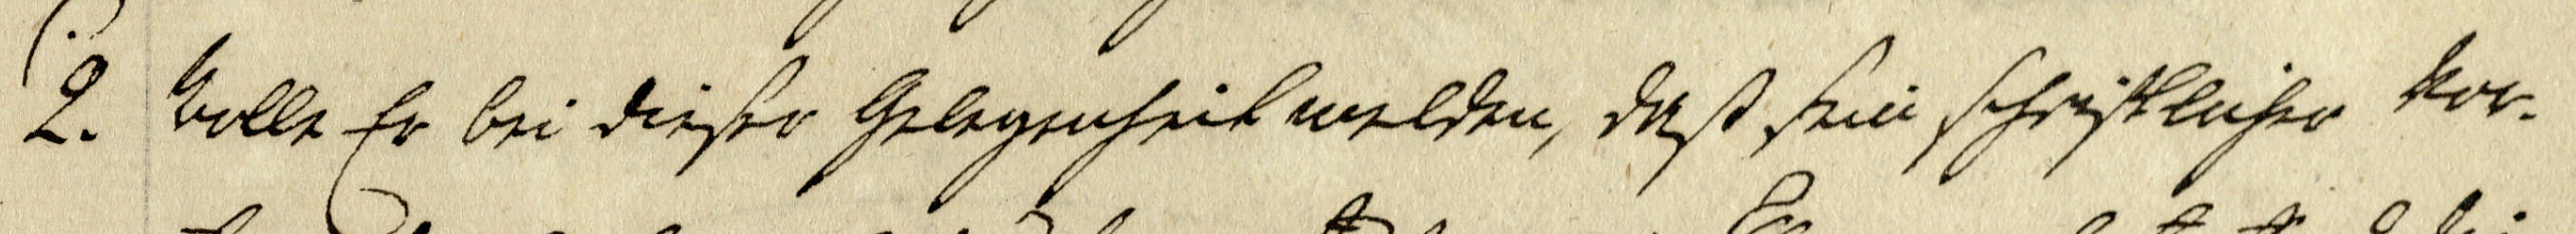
2. Wolle Er bei dieser Gelegenheit melden, daß sein schriftlicher Vor¬
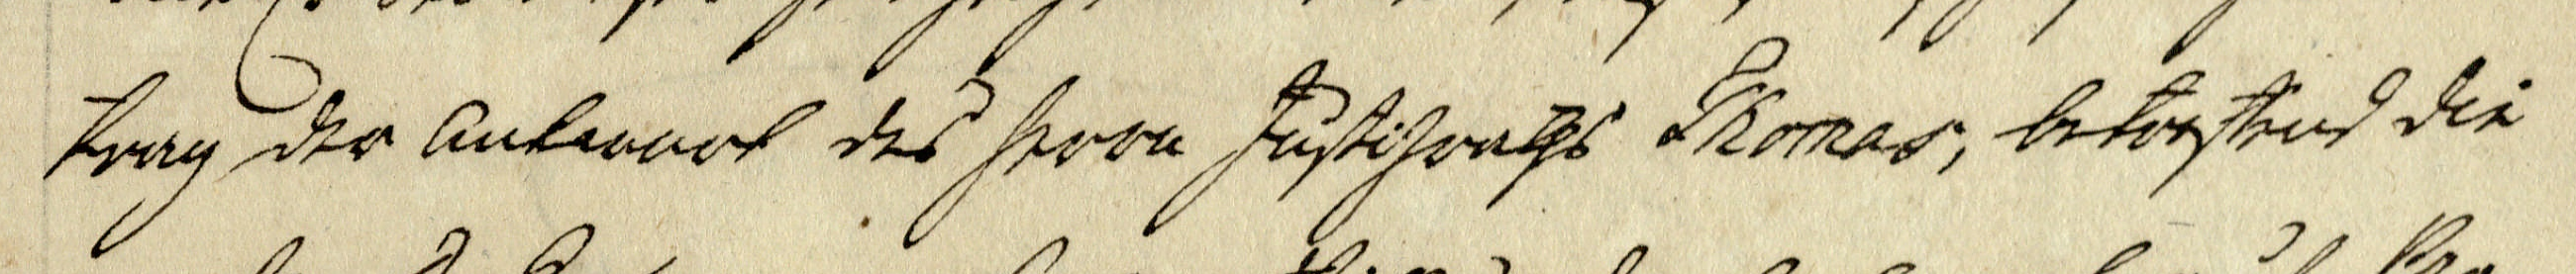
trag der Antwort des Herrn Justizraths Thomas, betreffend die
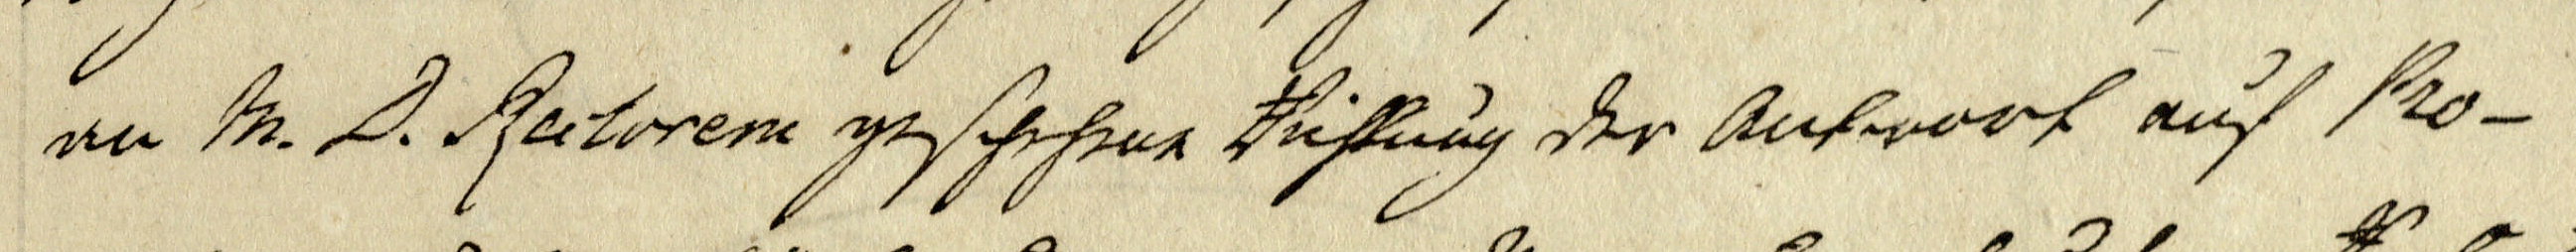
an M. D. Rectorem geschehene Richtung der Antwort auf Pro¬
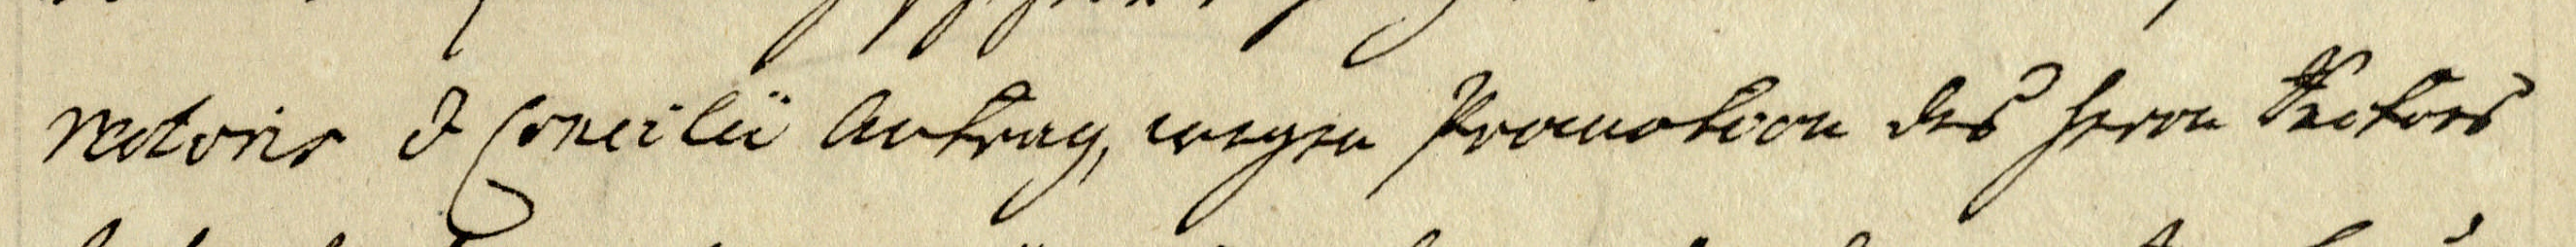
rectoris et Concilii Antrag, wegen Promotion des Herrn Rectors
